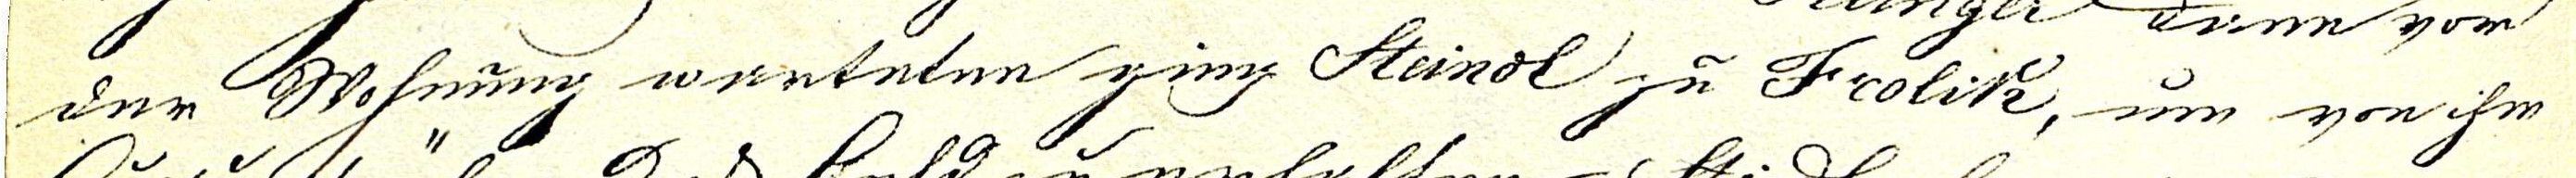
der Wohnung warteten ging Steindl zu Frolik, um von ihm
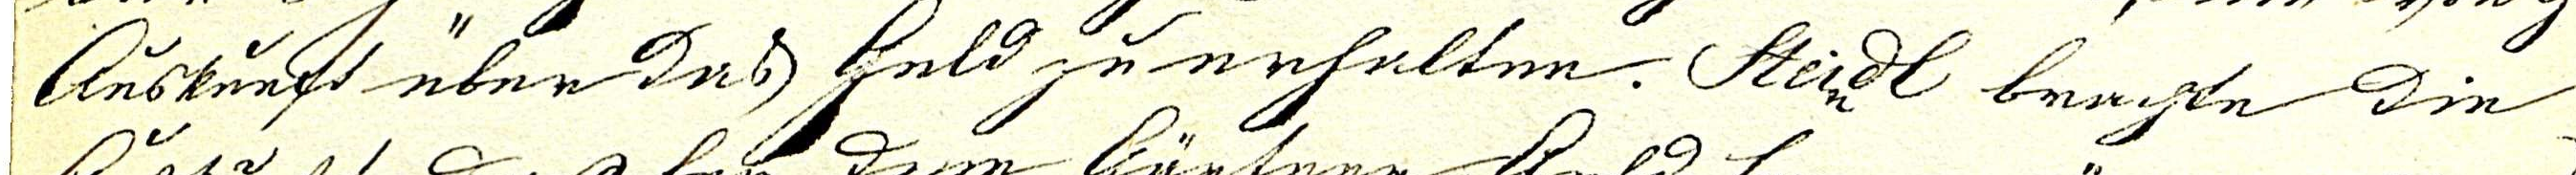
Auskunft über das Geld zu erhalten. Steidl brachte die
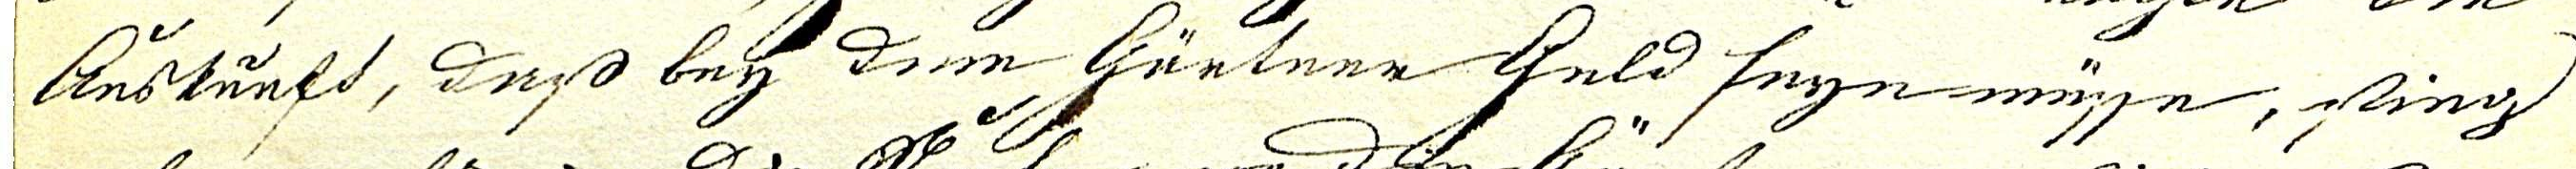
Auskunft, daß bey dem Gärtner Geld seyn müsse, stieg
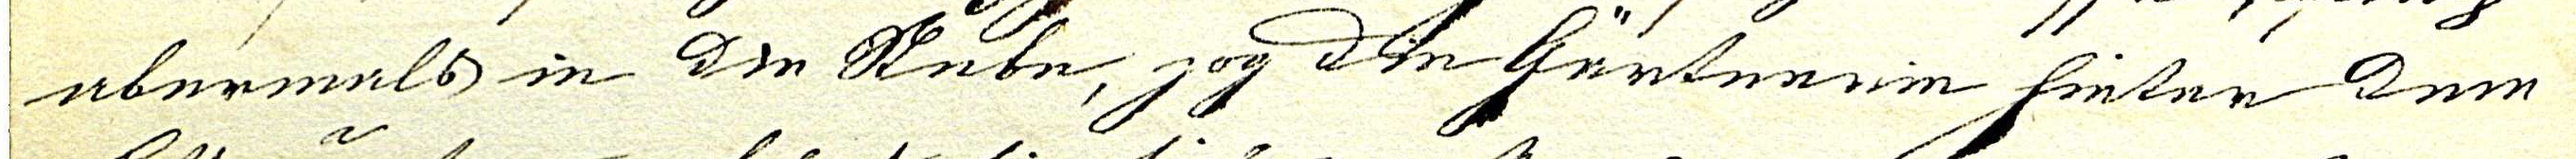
abermals in die Stube, zog die Gärtnerin hinter dem
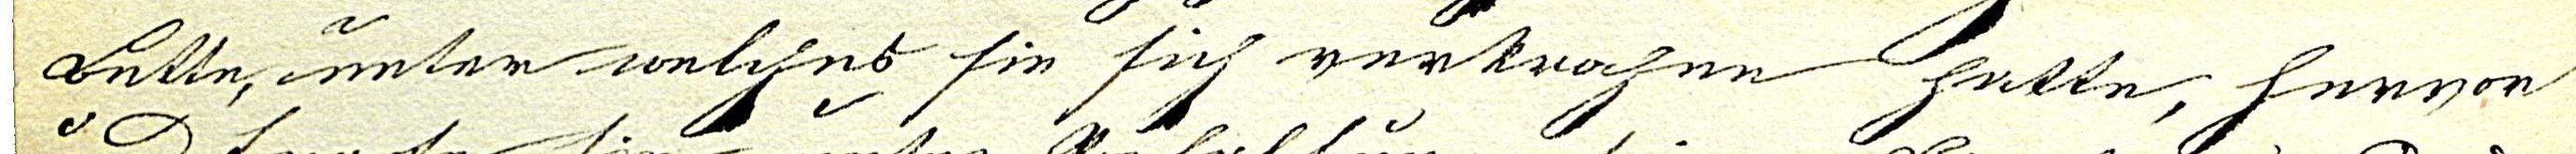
Bette, unter welches sie sich verkrochen hatte, hervor
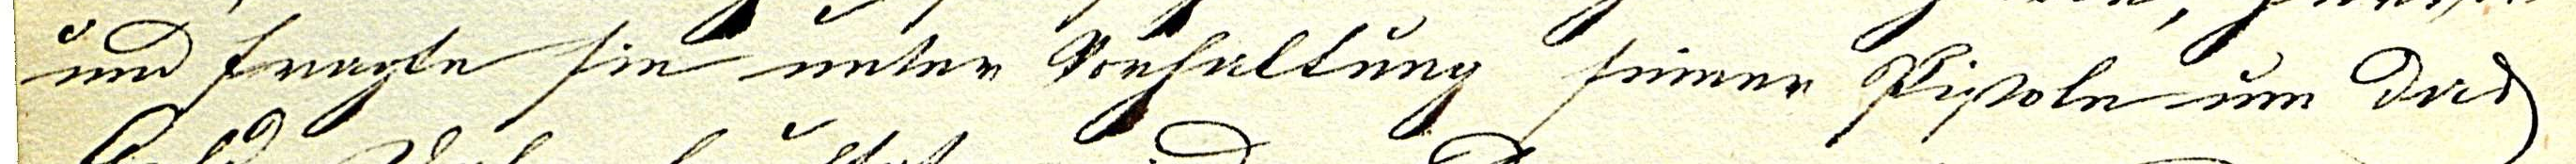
und fragte sie unter Vorhaltung seiner Pistole um das
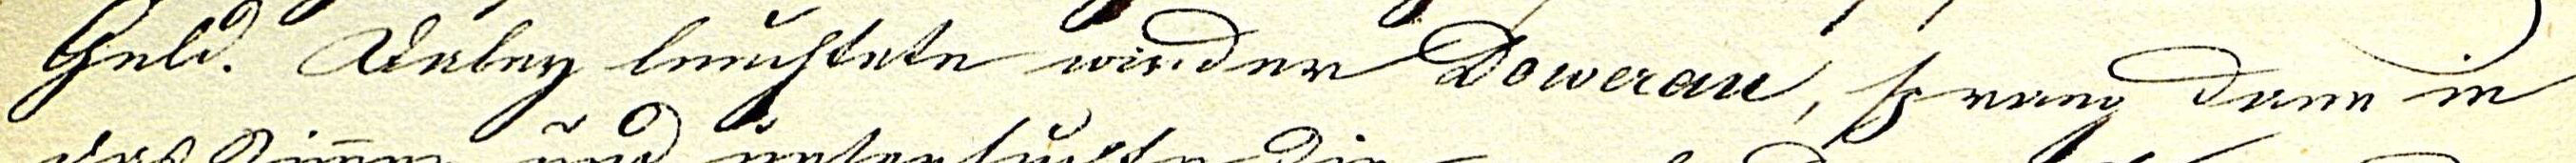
Geld. Dabey leuchtete wirder Dowerau, sprang dann in
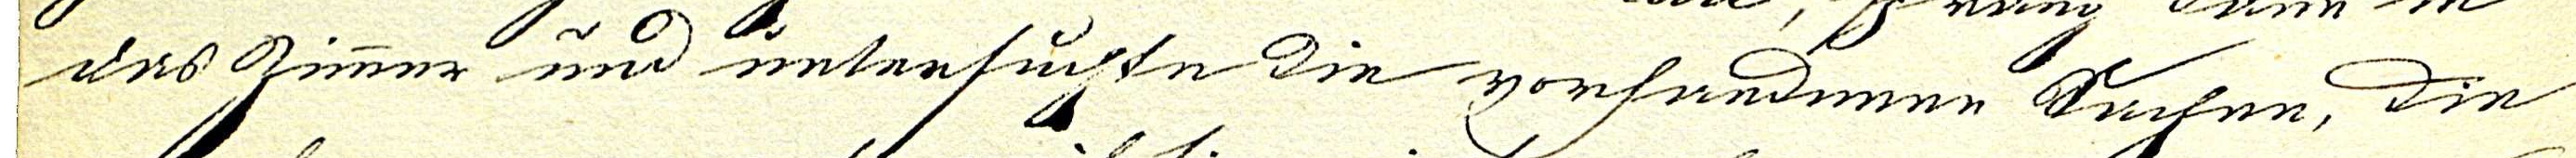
das Zimmer und untersuchte die vorhandenen Sachen, die
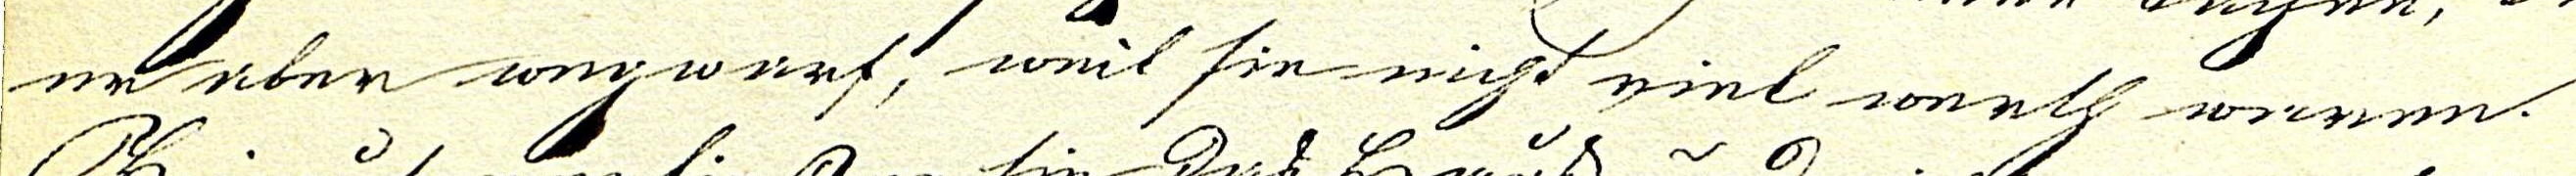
er aber wegwarf, weil sie nicht viel werth waren.
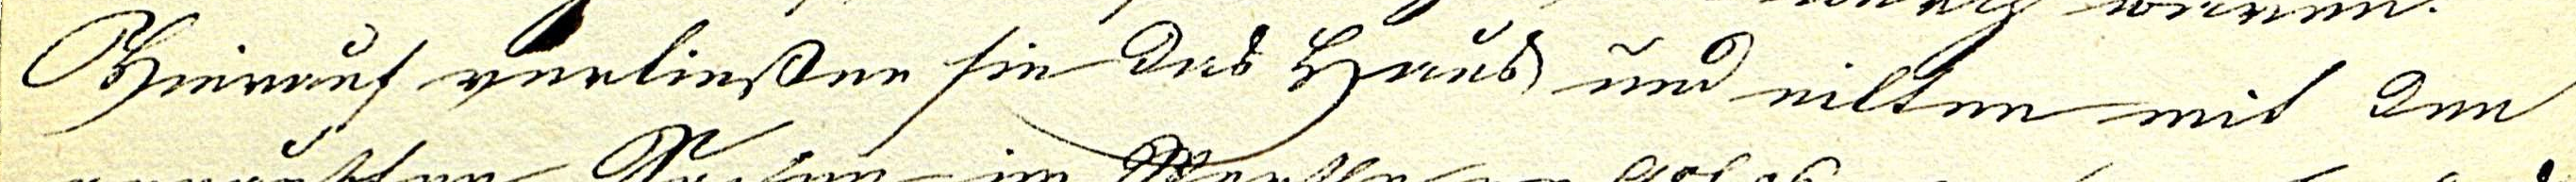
Hierauf verließen sie das Haus und eilten mit den
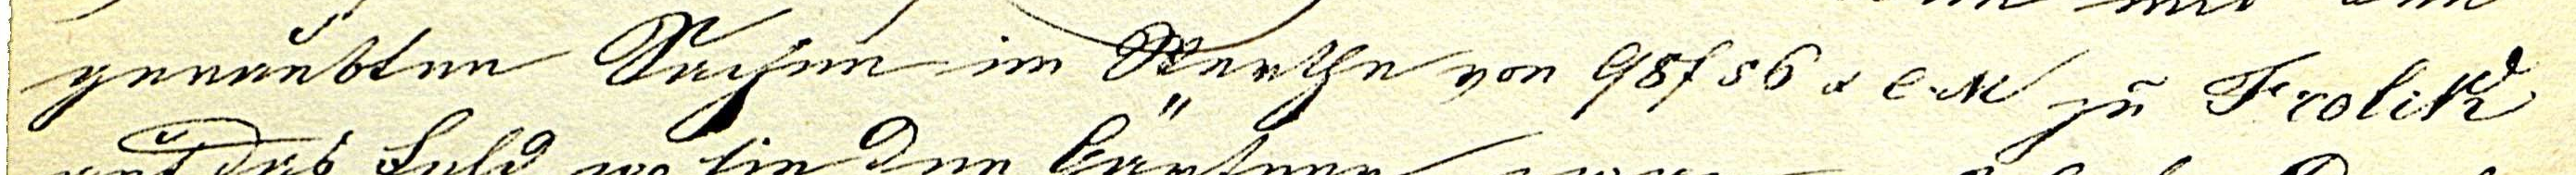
geräubten Sachen im Werthe von 98f 56x CM zu Frolik
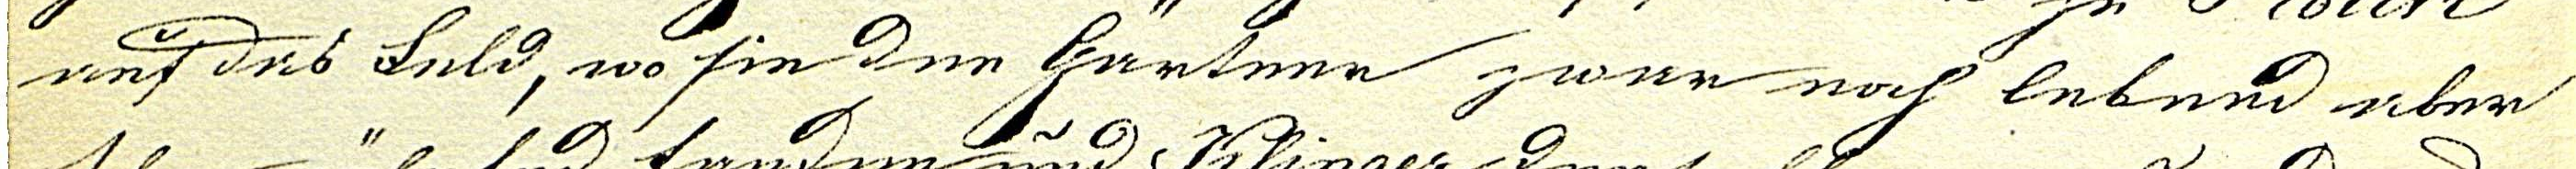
auf das Feld, wo sie den Gärtner zwar noch lebend aber
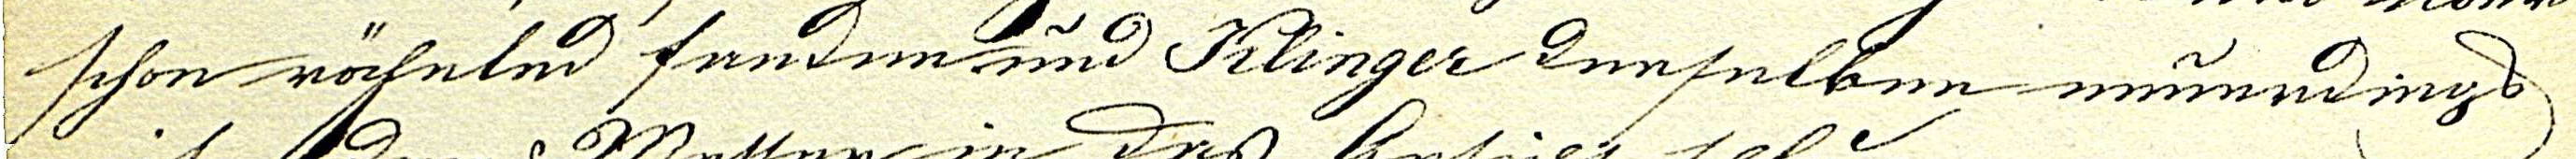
schon röchelnd fanden und Klinger derselben neuerdings
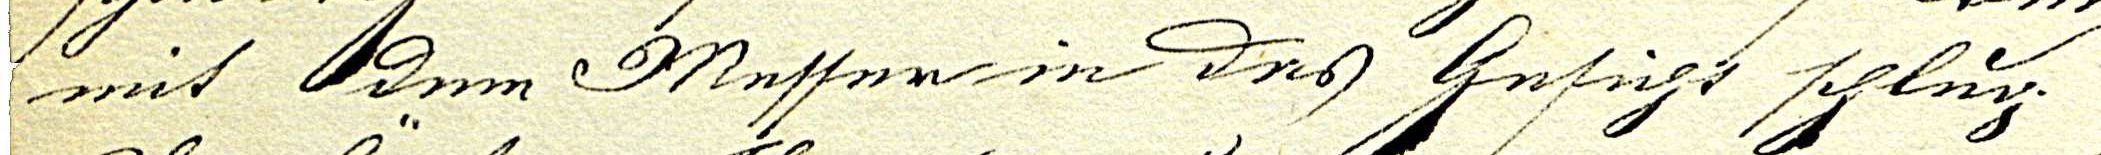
mit dem Messer in das Gesicht schlug.
